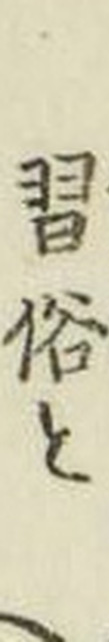習俗と
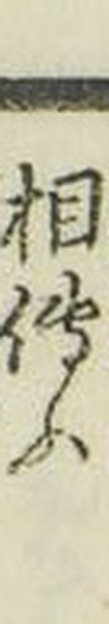相傳ふ
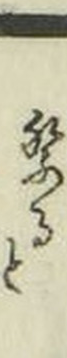祭ると

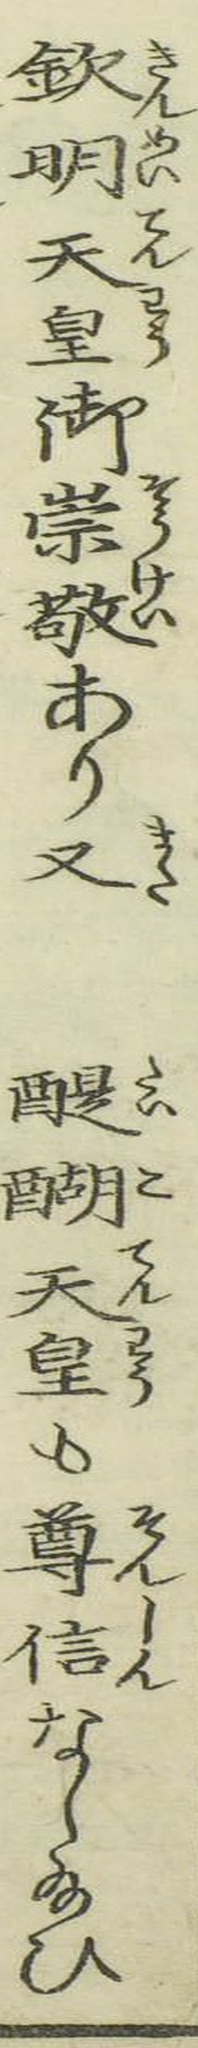欽明天皇御崇敬あり又醍醐天皇も尊信なし給ひ
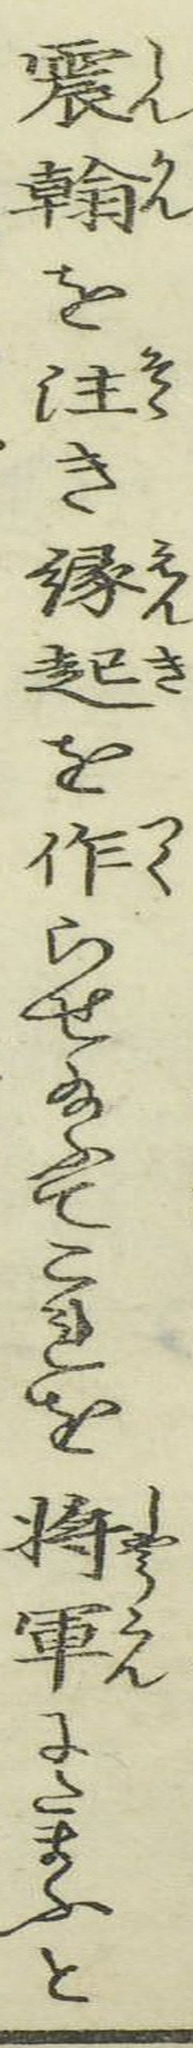震翰を注き縁起を作らせ給ふてこれを将軍にたまふと
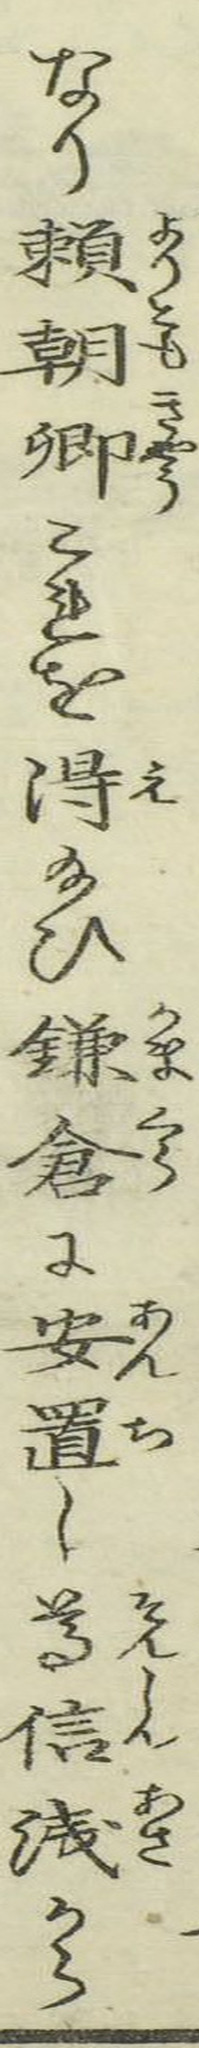なり頼朝卿これを得給ひ鎌倉に安置し尊信浅から
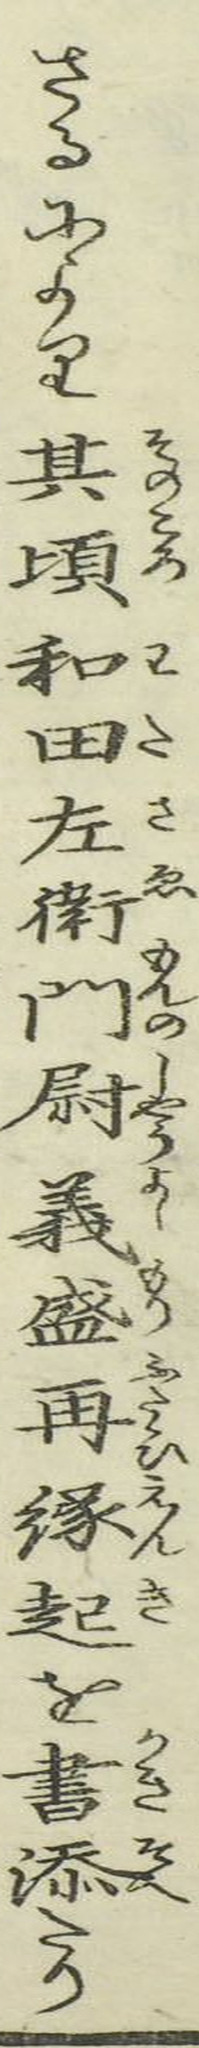さるにより其頃和田左衛門尉義盛再縁起を書添たり
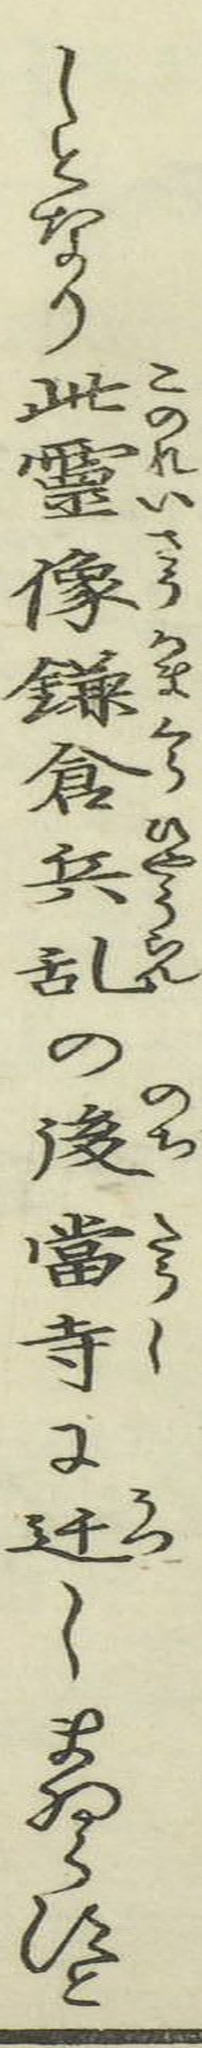しとなり此霊像鎌倉兵乱の後當寺に遷しまゐらすと
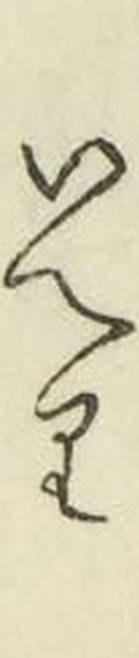いへり
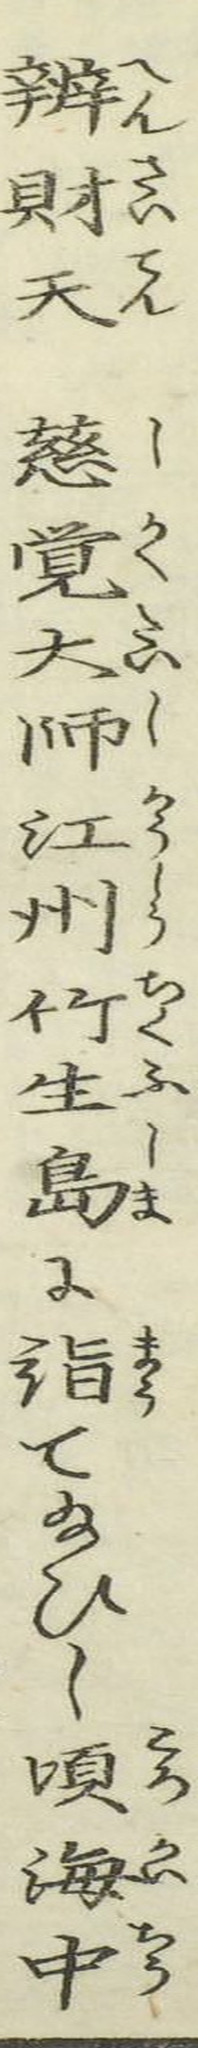辨財天慈覚大師江州竹生島に詣て給ひし頃海中
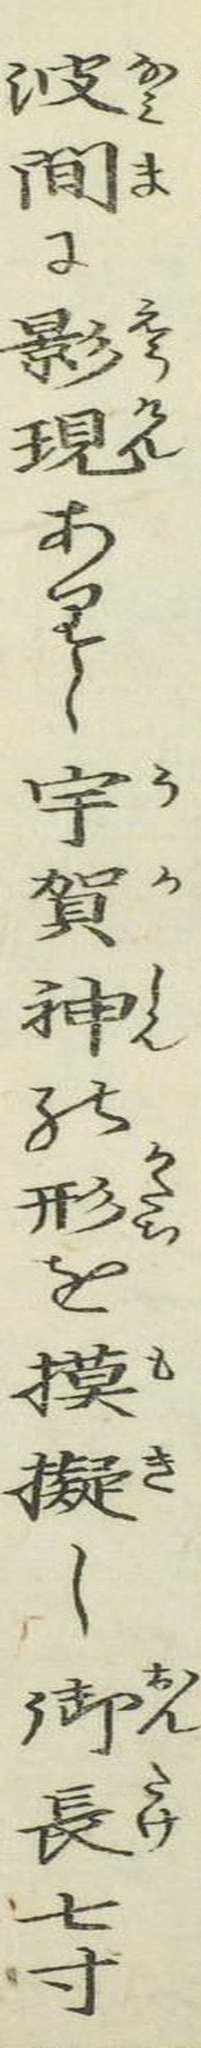波間に影現ありし宇賀神の形を摸擬し御長七寸
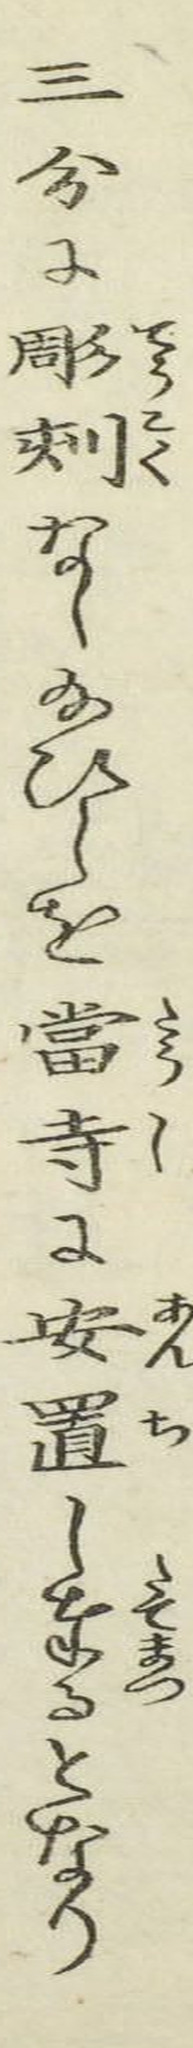三分に彫刻なし給ひしを當寺に安置し奉るとなり
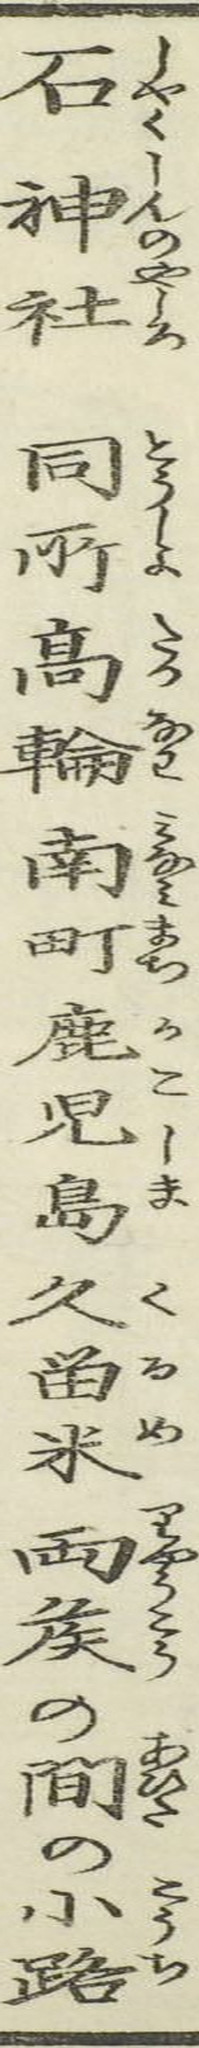石神社同所高輪南町鹿児島久留米両侯の間の小路
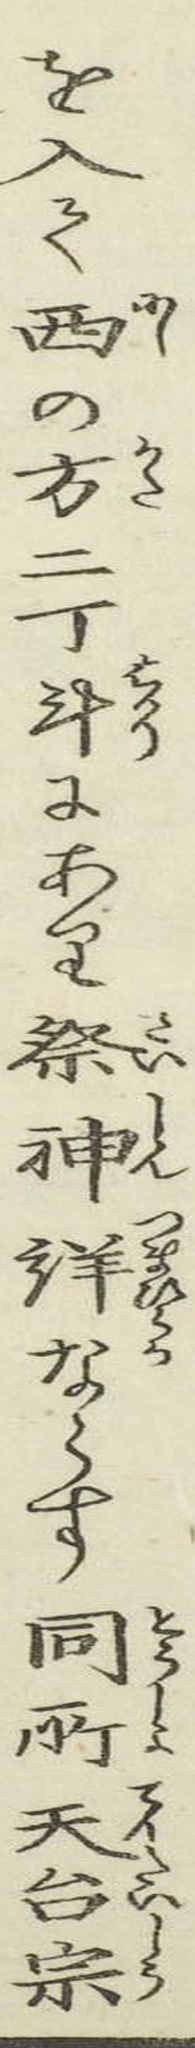を入て西の方二丁斗にあり祭神詳ならす同所天台宗
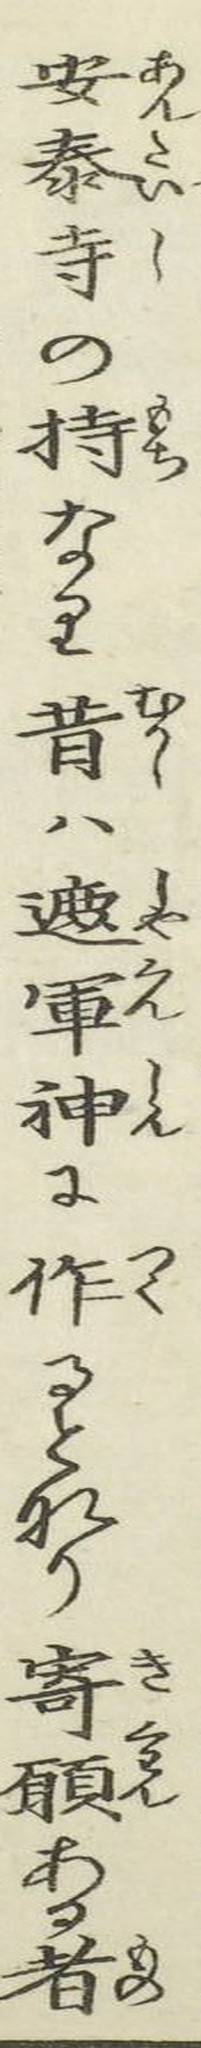安泰寺の持なり昔は遮軍神に作るとなり寄願ある者
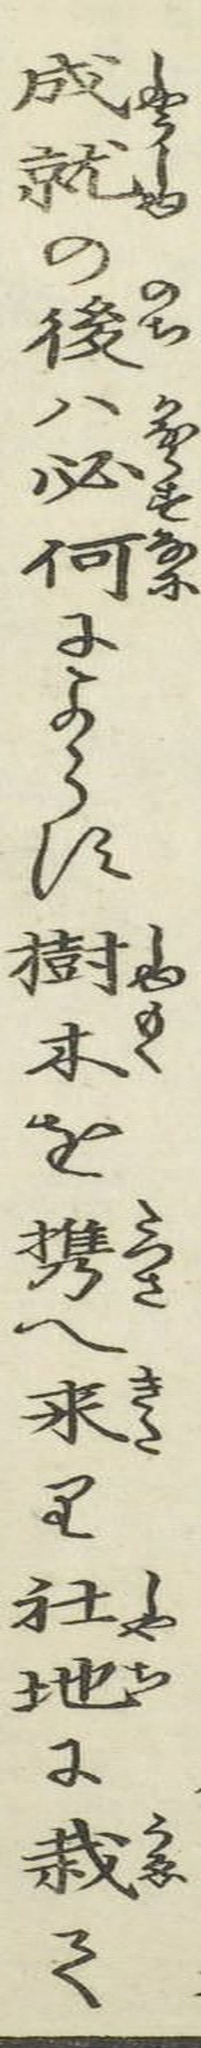成就の後は必何によらす樹木を携へ来り社地に栽て
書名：江戸名所図会 20巻 巻之3
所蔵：東京学芸大学教育コンテンツアーカイブ
